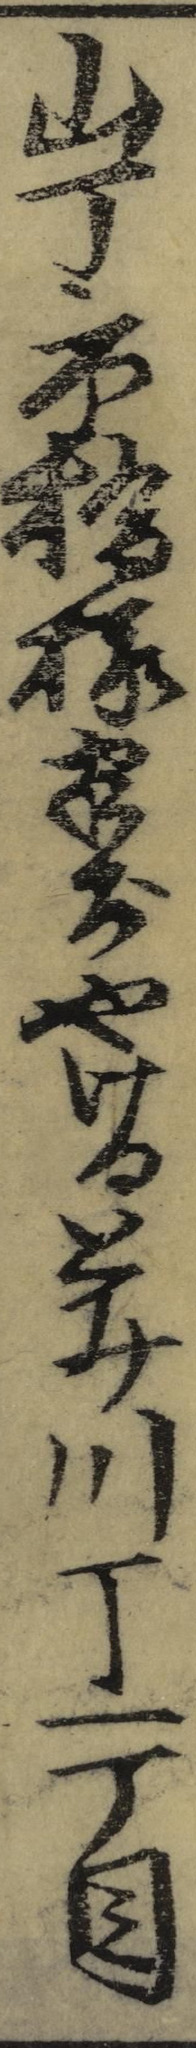山丁市橋様半分やけるとみ川丁一丁目
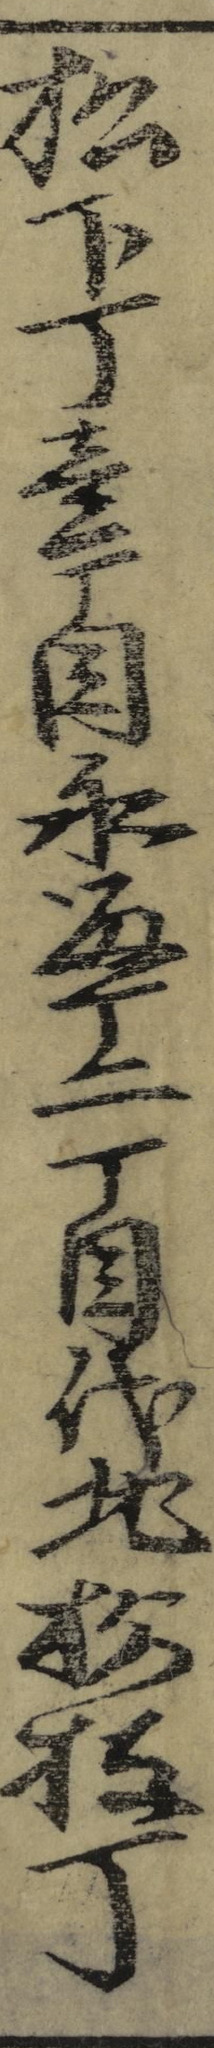松下丁壱丁目永富丁二丁目代地松枝丁
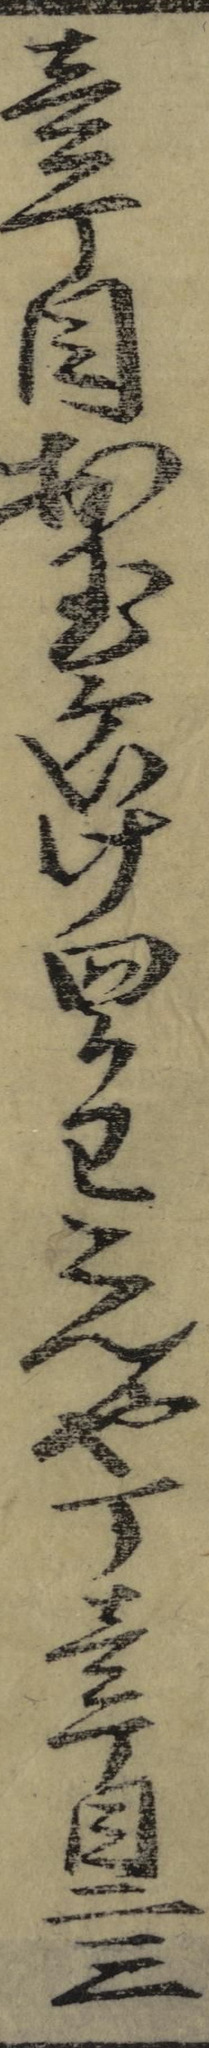壱丁目お玉ケいけ向かわこんや丁壱丁目二三
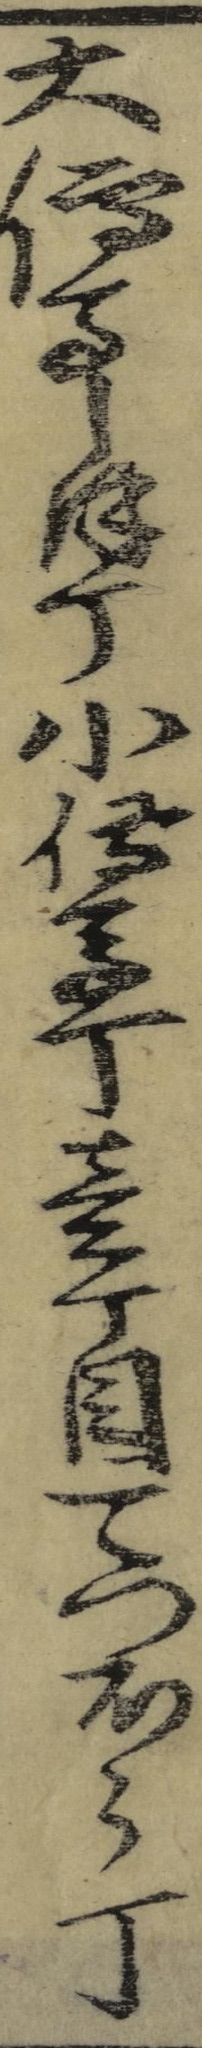大伝馬しほ丁小伝馬丁壱丁目てつほう丁
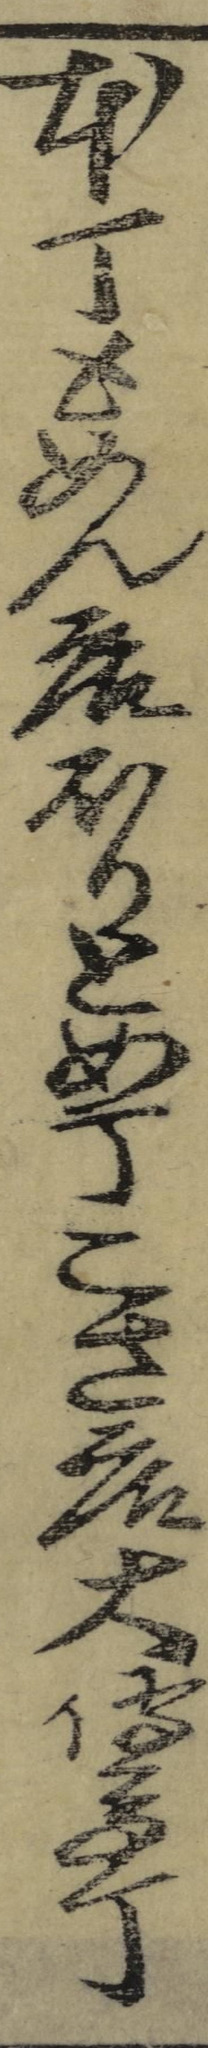本丁もめん店ほりとめ丁こさ店大伝馬丁
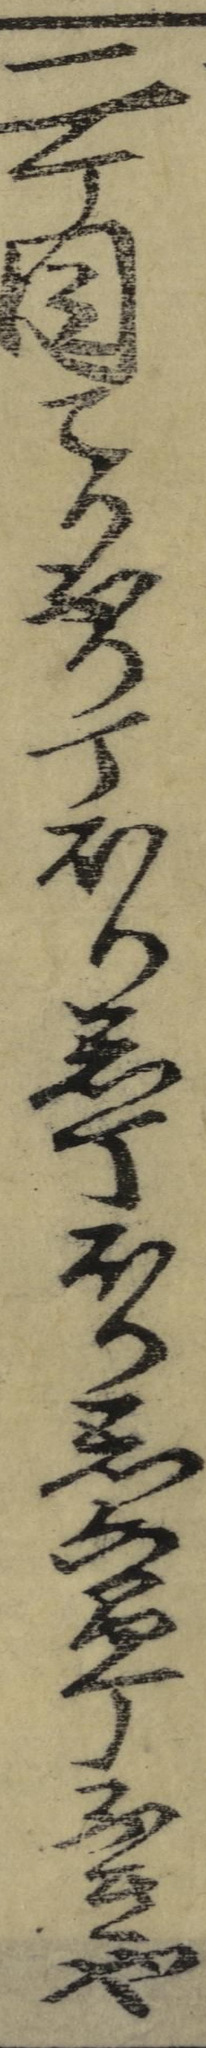二丁目てりふり丁ほりゑ丁ほりゑ六間丁ふきや
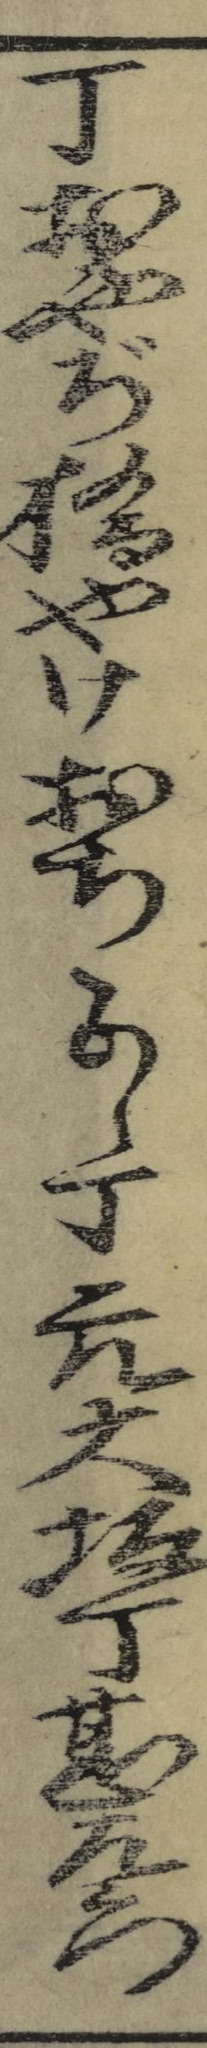丁おやぢ橋やけおちよし丁元大坂丁甚左衛門
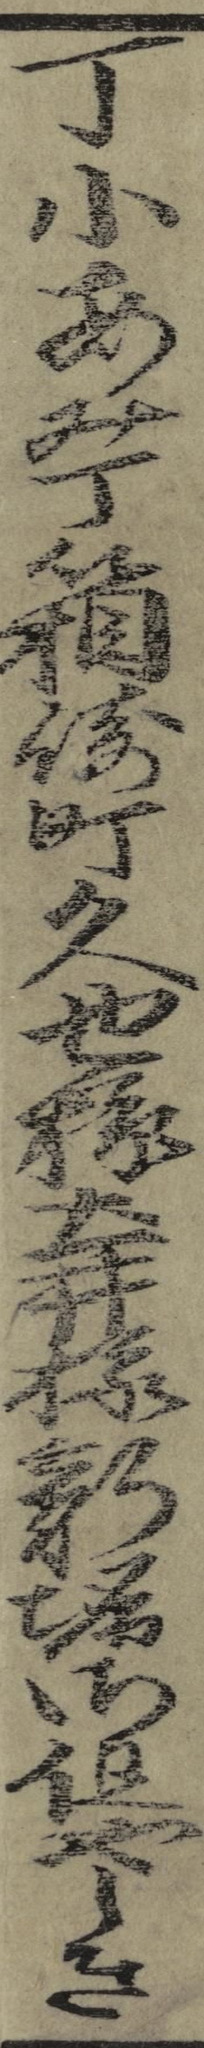丁小あみ丁箱崎町久世様土井様新堀御組やしき
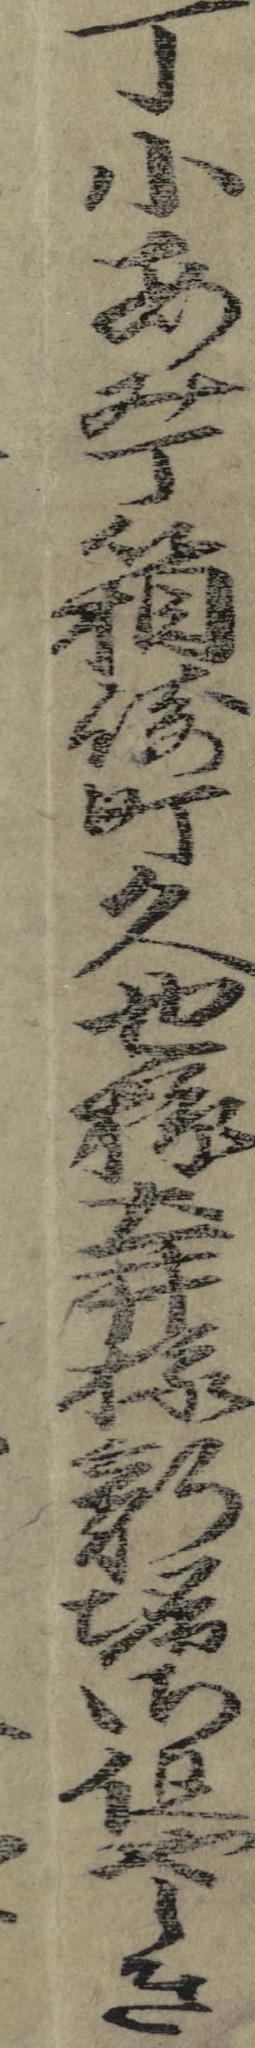丁小あみ丁箱崎町久世様土井様新堀御組やしき
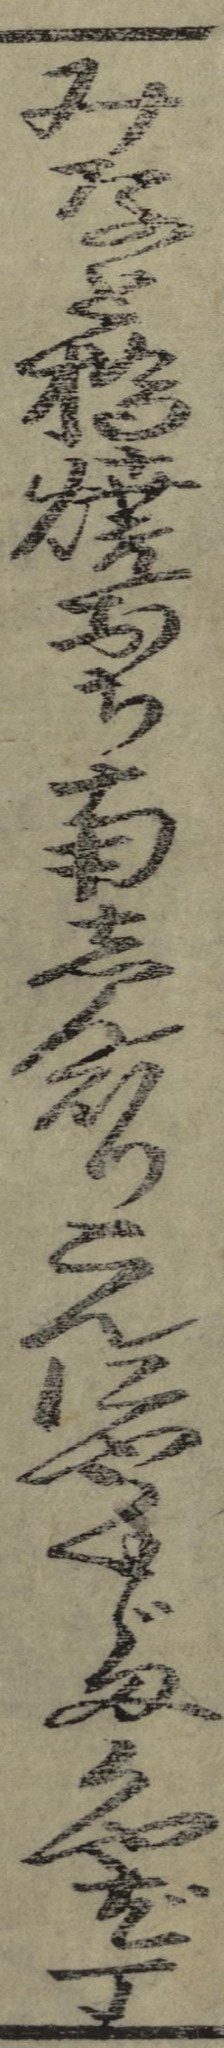みなと橋焼おち南しんほりこんにやくじまかやば丁
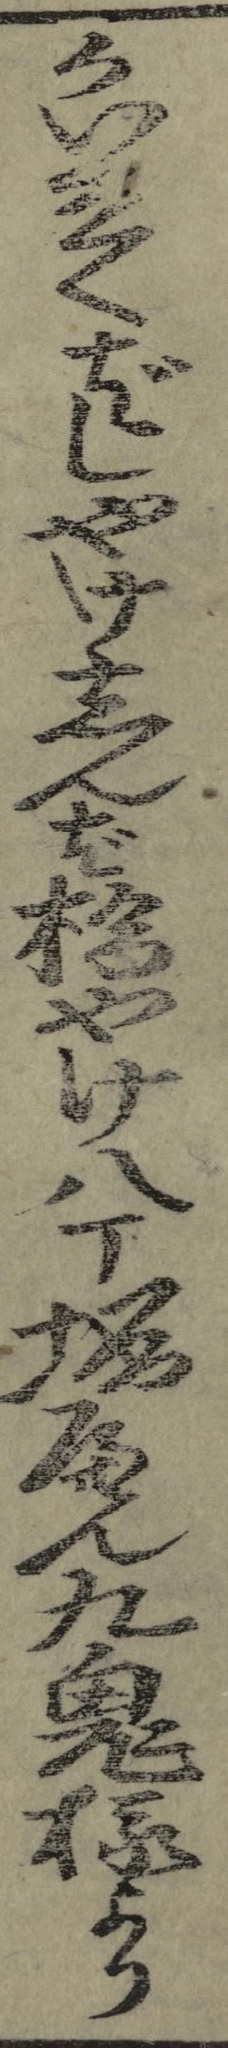かいそくばしやけしんば橋やけ八丁堀へん九鬼様より
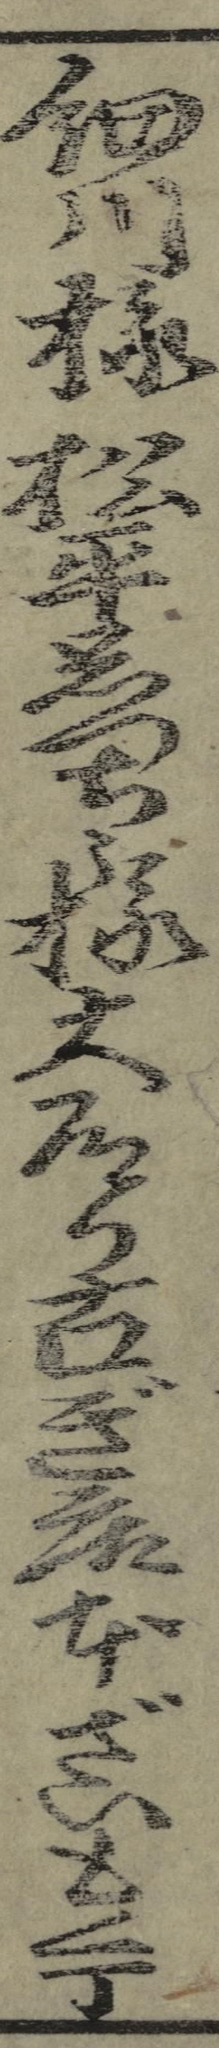細川様松平ゑつちふ様大道り古ぎ店本ざいもく丁
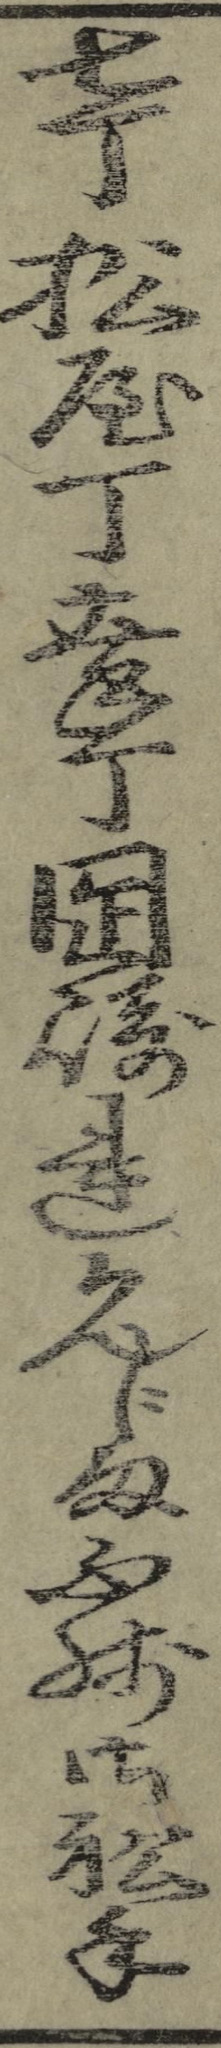七丁松屋丁幸丁岡崎れかんじま不残御船手
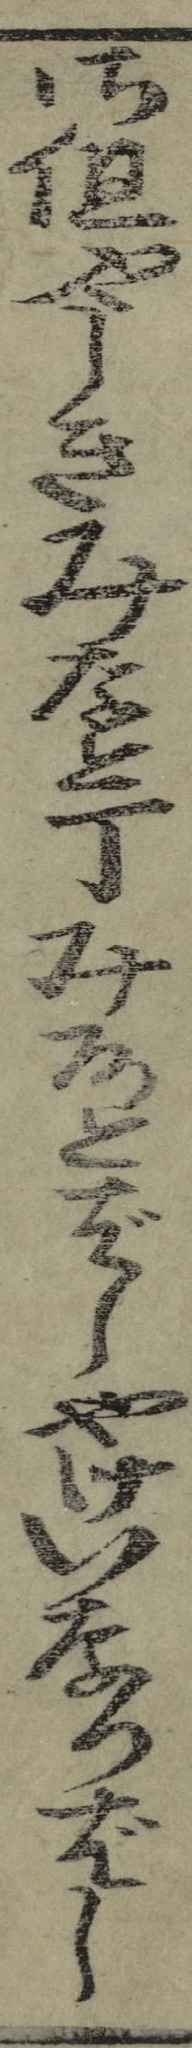御組やしきみなと丁みなとばしやけいなりばし
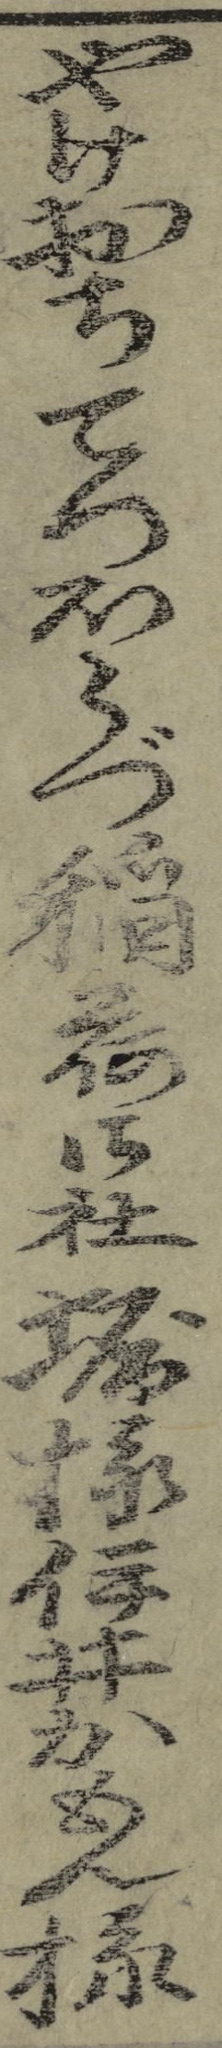やけおちてつほうづ稲荷御社堀様伊井かもん様
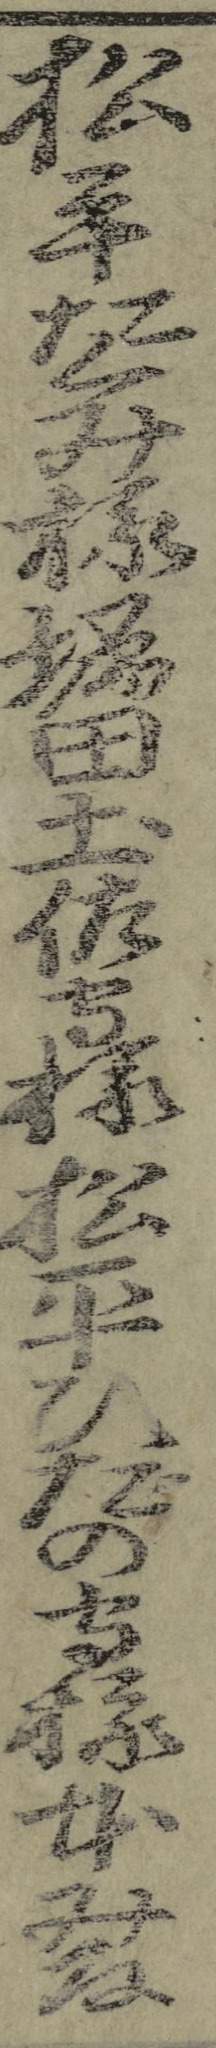松平たくみ様堀田土佐守様松平ひだの守様本みな
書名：[弘化三年一月の江戸大火に関する瓦版]
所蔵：東京大学地震研究所図書室 Earthquake Research Institute Library, The University of Tokyo, JAPAN
